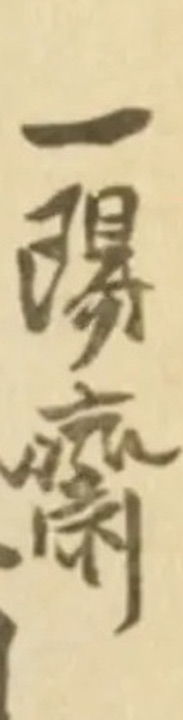一陽斎
